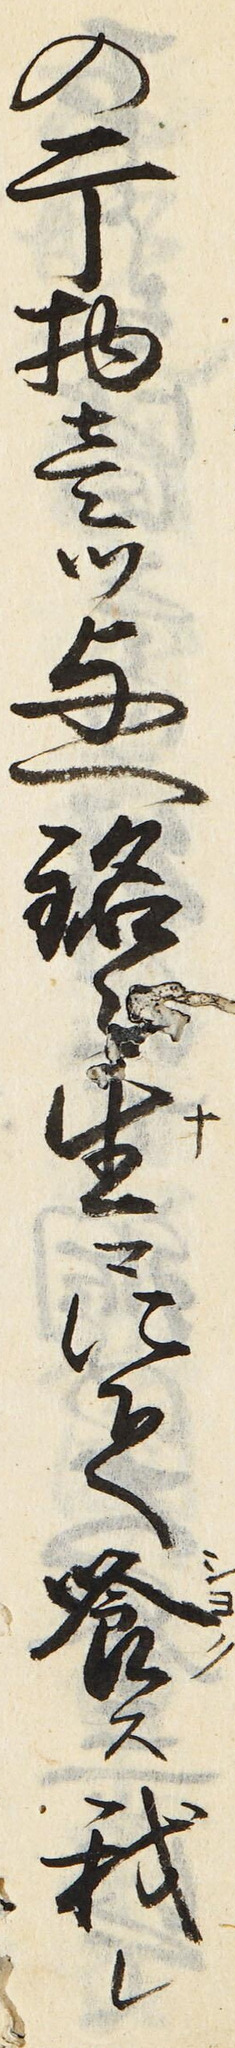の干物壱つ与へ銘々生まにて喰す我れ
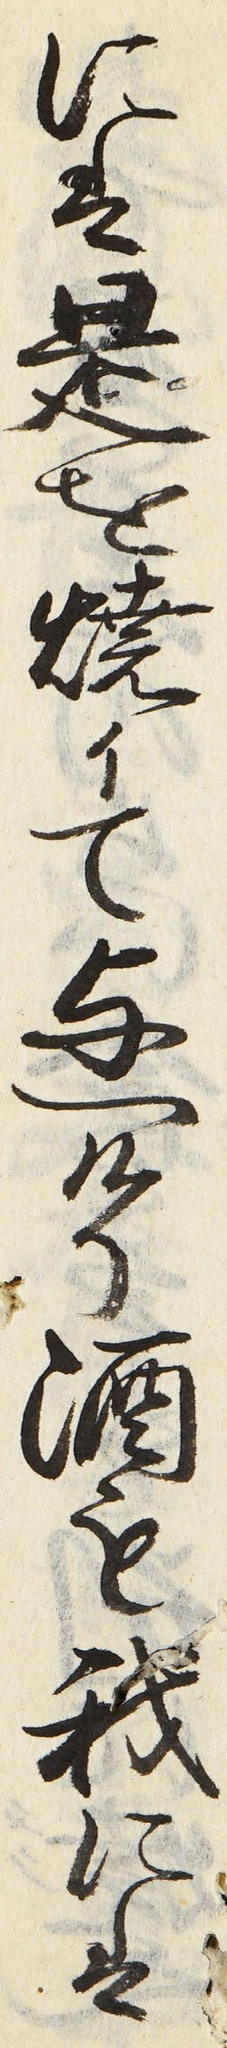には是を焼いて与へけり酒も我には
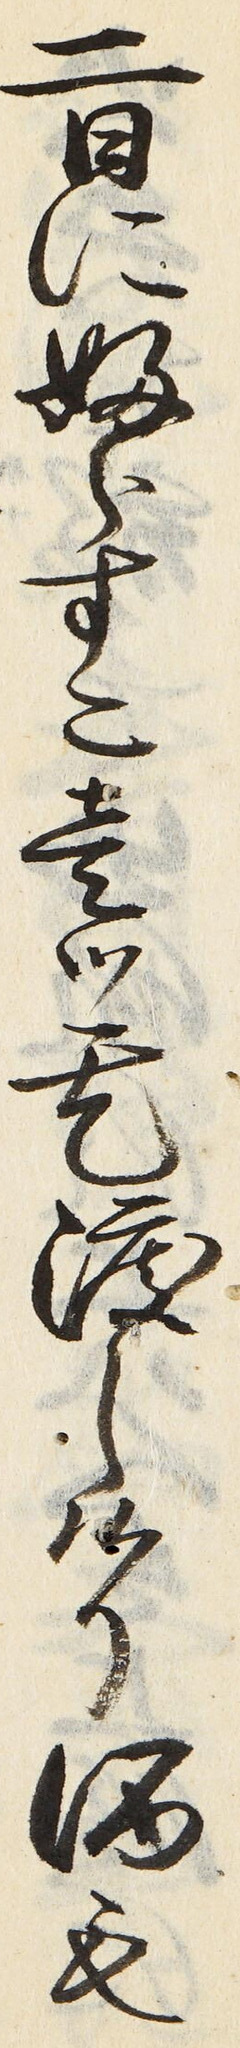二日にふらすこ壱ツ渡しけり酒も
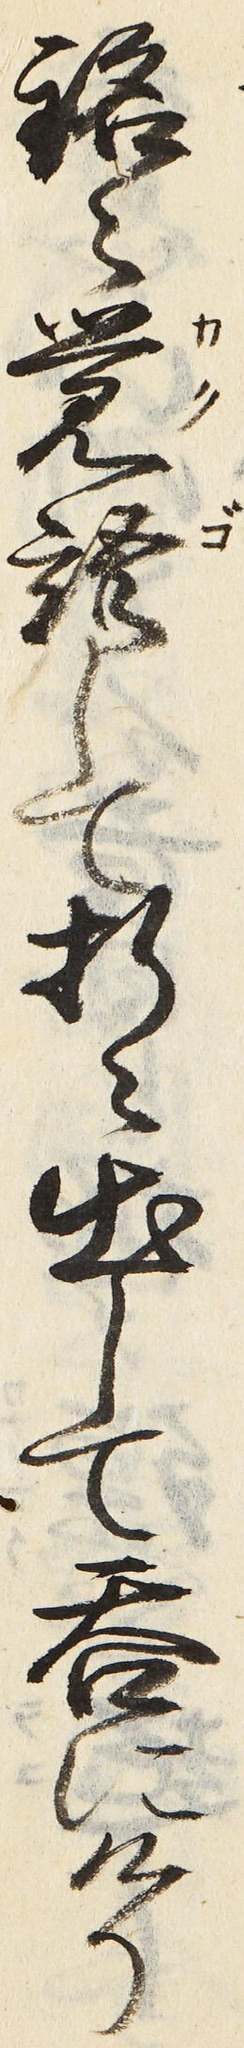銘々覚語して折々出して呑にけり
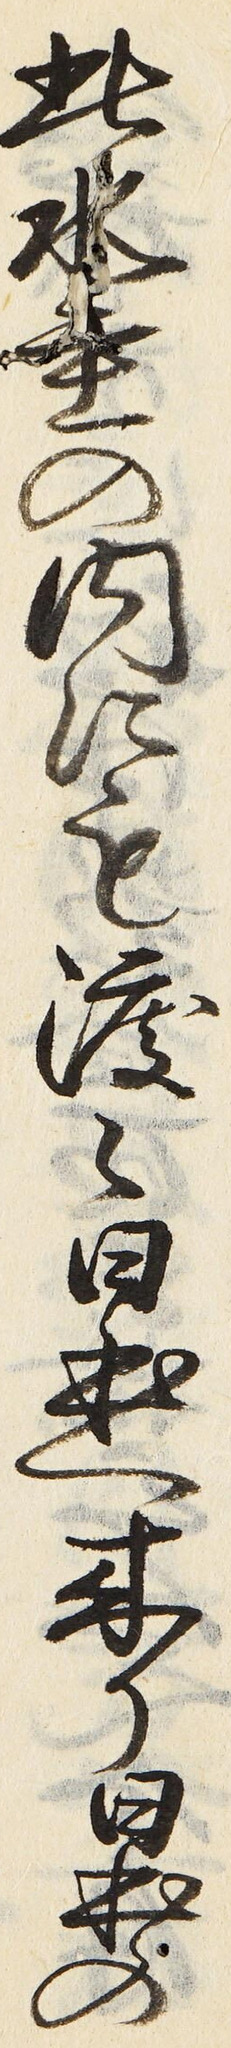此水主の内にも渡々日本へ来り日本の
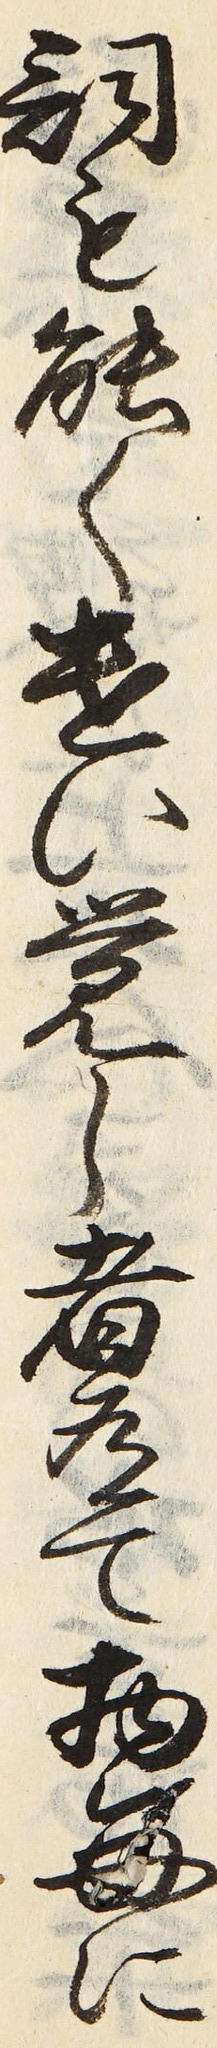詞を能く遣ひ覚し者有て物毎に
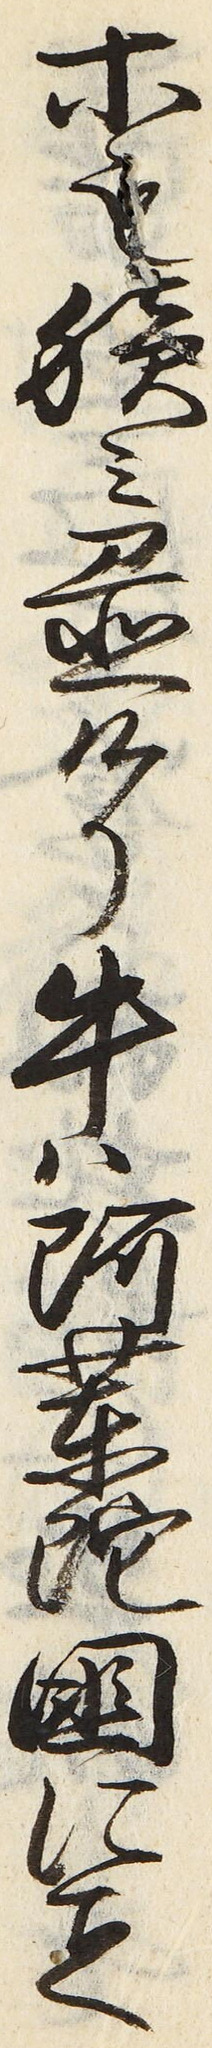等も積み置けり牛は阿蘭陀国にて
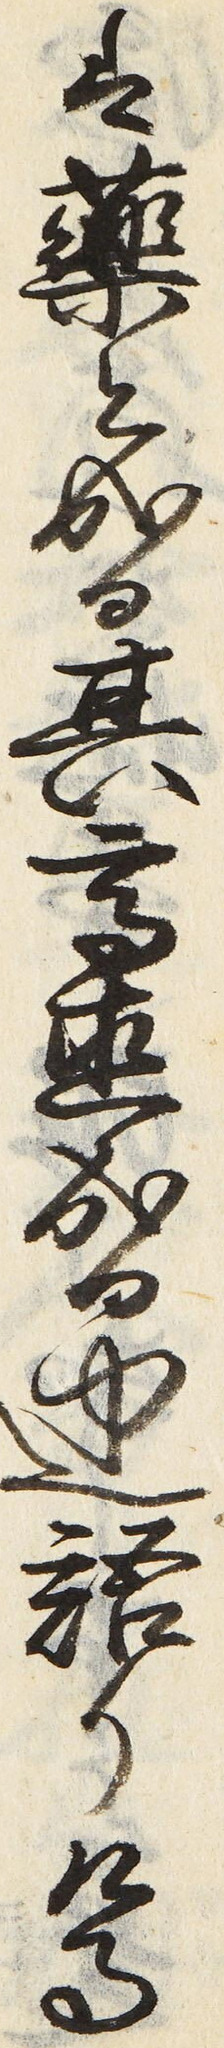は薬と成る其高直成る迚語りける
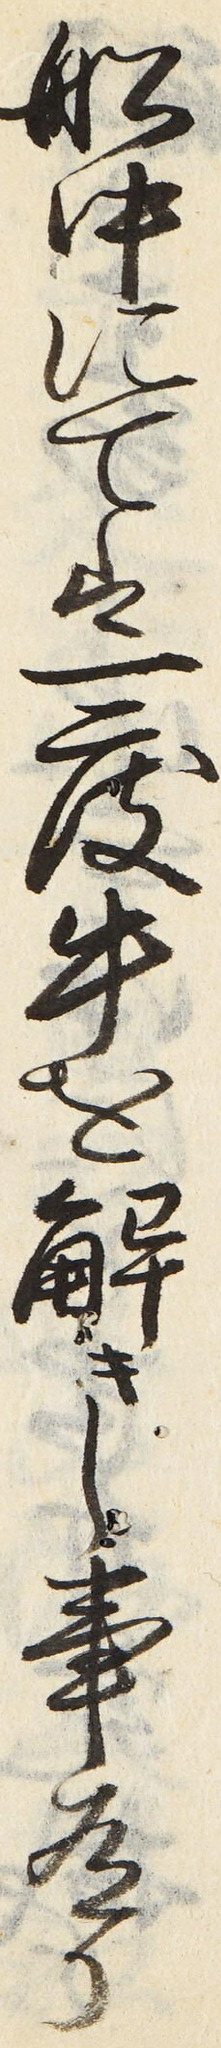船中にては一度牛を解きし事有り
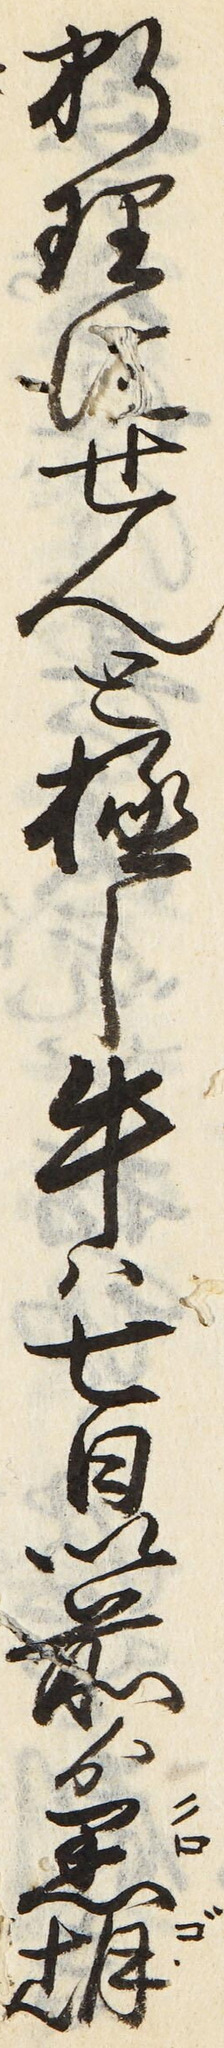料理にせんと極し牛は七日以前ゟ黒胡
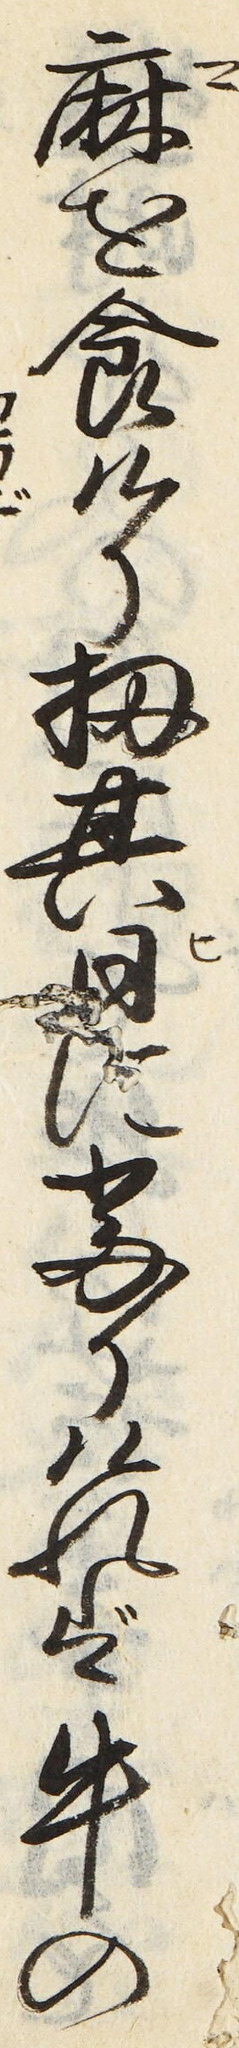麻を食けり扨其日に当りければ牛の
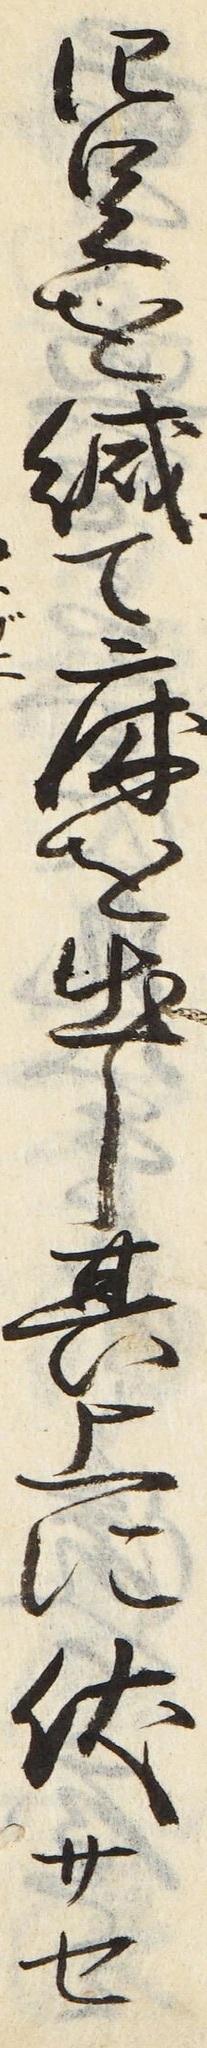四足を縅て床を出し其上に伏させ
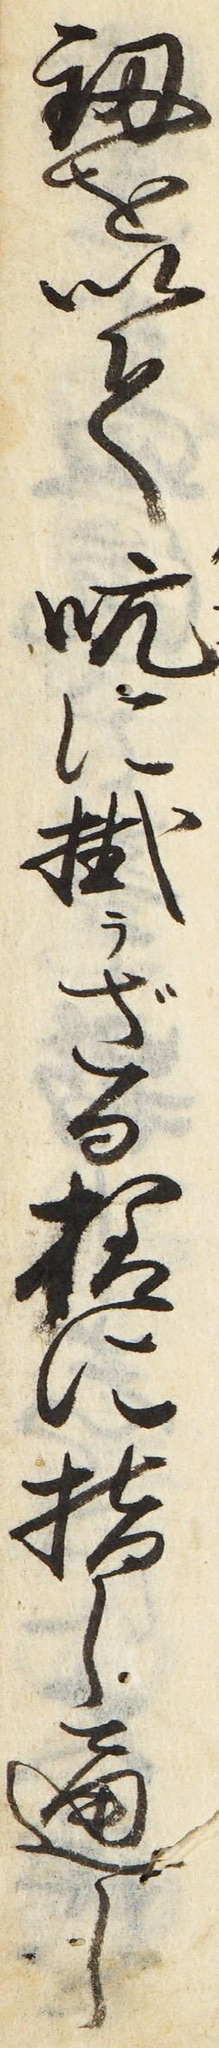釼を以て吭に掛らざる様に指し通し

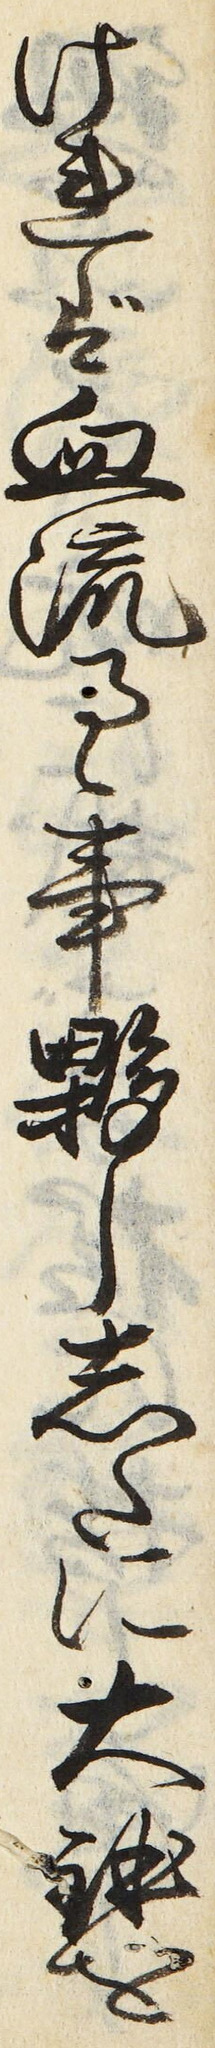ければ血流るゝ事夥ししたに大鉢を
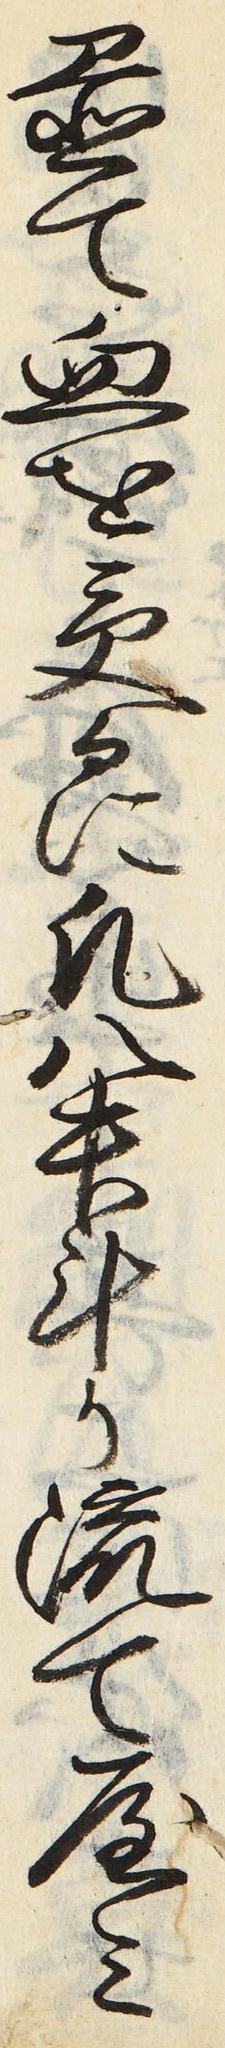置て血を受るに凡八升計り流てやみ
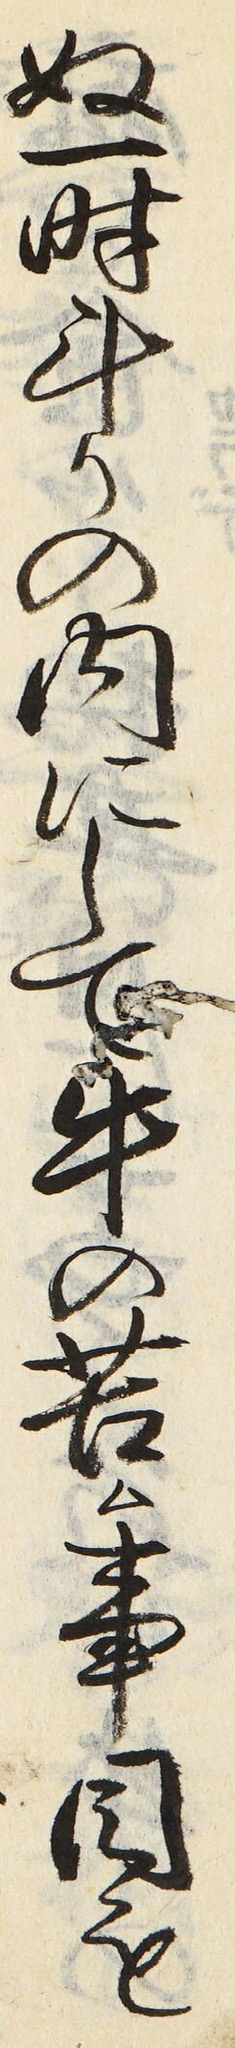ぬ一時計りの内にして牛の苦む事目を
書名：華夷九年録
